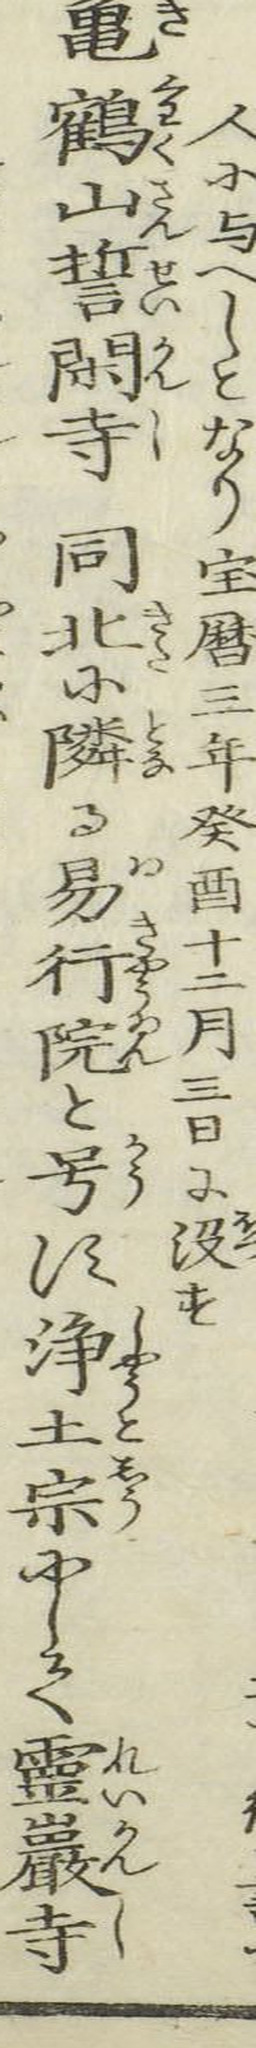亀鶴山誓閑寺同北に隣る易行院と号す浄土宗にして霊巌寺
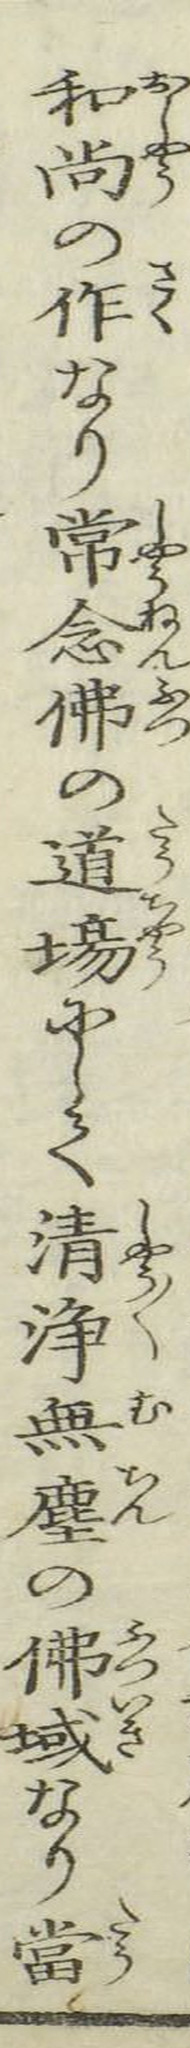和尚の作なり常念仏の道場にして清浄無塵の仏域なり当
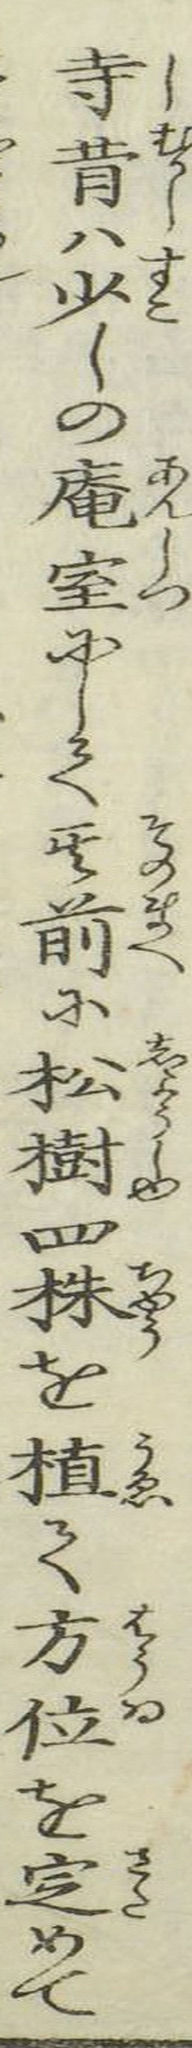寺昔は少しの庵室にして其前に松樹四株を植て方位を定めて
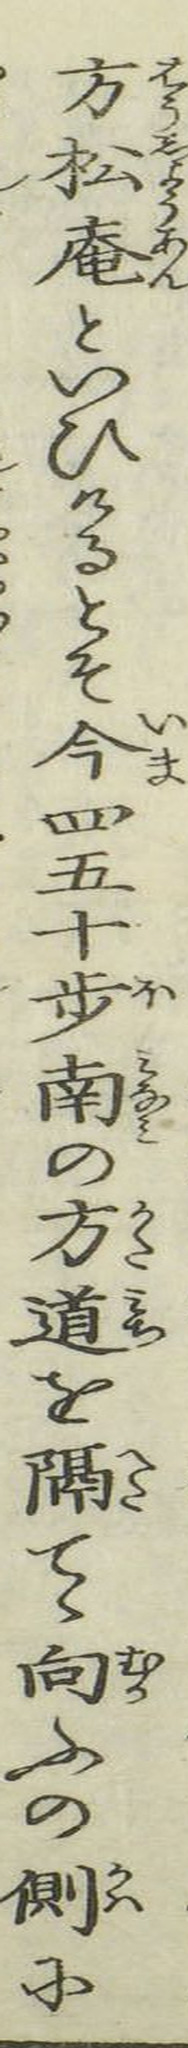方松庵といひけるとそ今四五十歩南の方道を隔てゝ向ふの側に
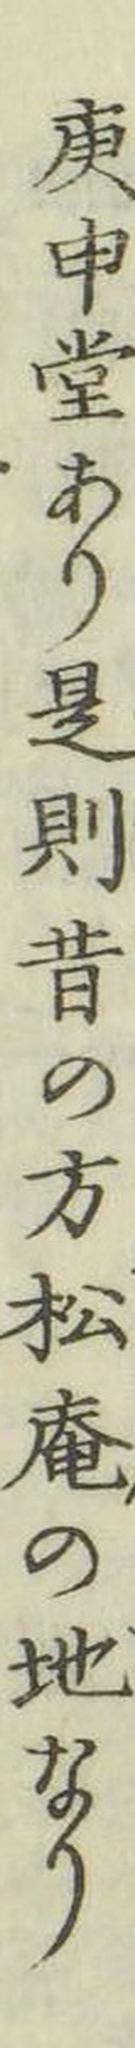庚申堂あり是則昔の方松庵の地なり

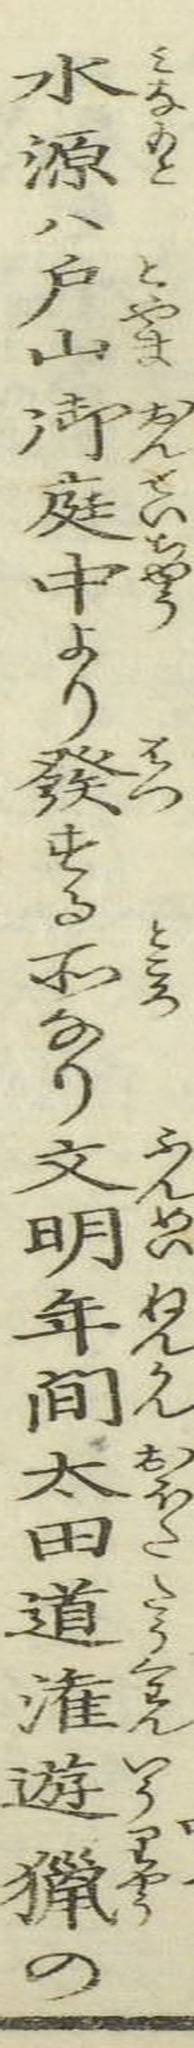水源は戸山御庭中より発する所なり文明年間太田道灌遊猟の
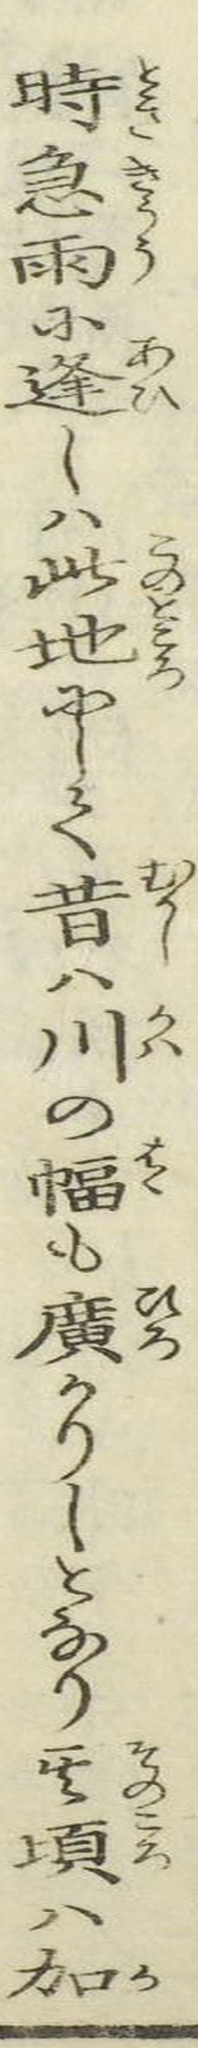時急雨に逢しは此地にて昔は川の幅も広かりしとなり其頃は加
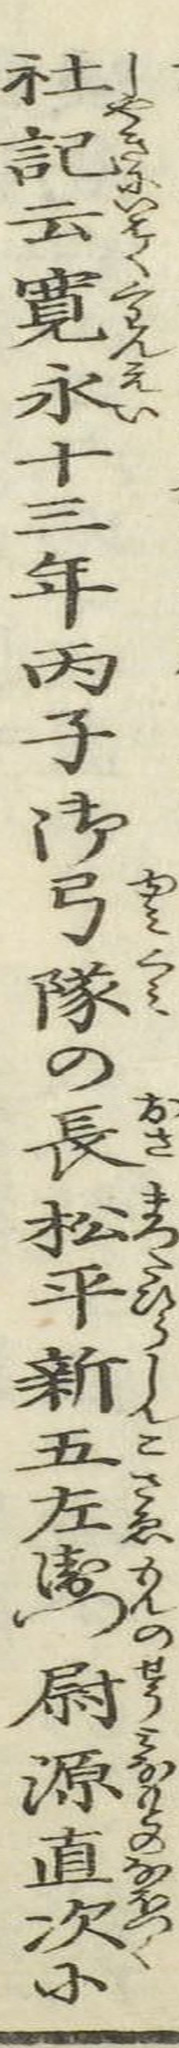社記云寛永十三年丙子御弓隊の長松平新五左衛門尉源直次に
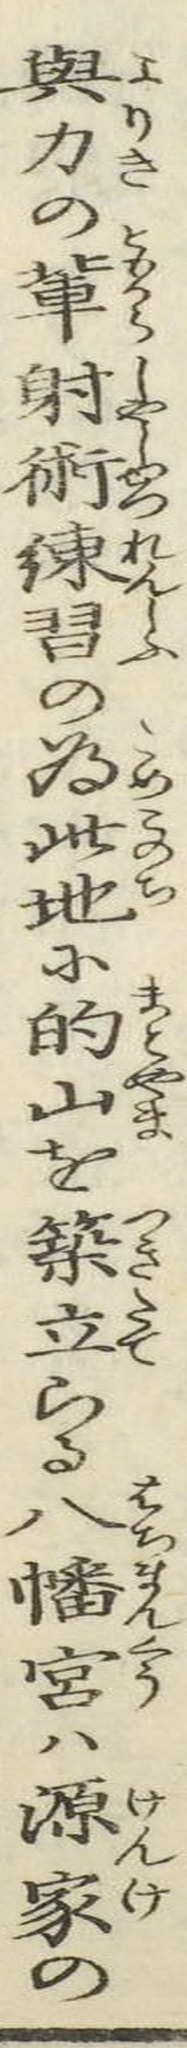与力の輩射術練習の為此地に的山築立らる八幡宮は源家の
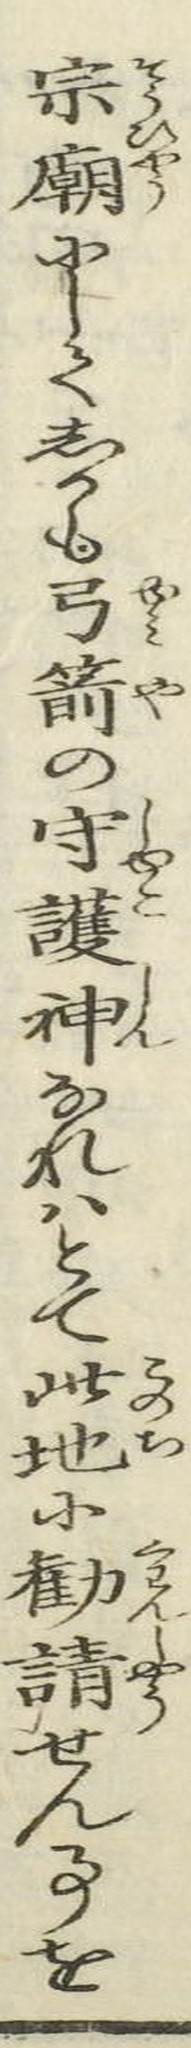宗廟にしてしかも弓箭の守護神なれはとて此地に勧請せん事を
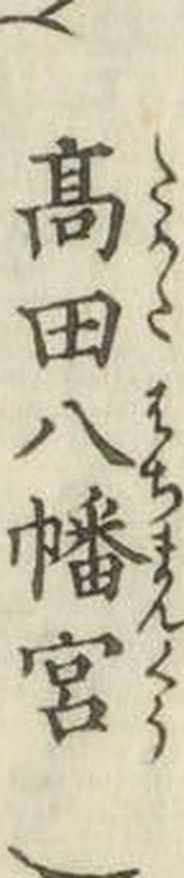髙田八幡宮

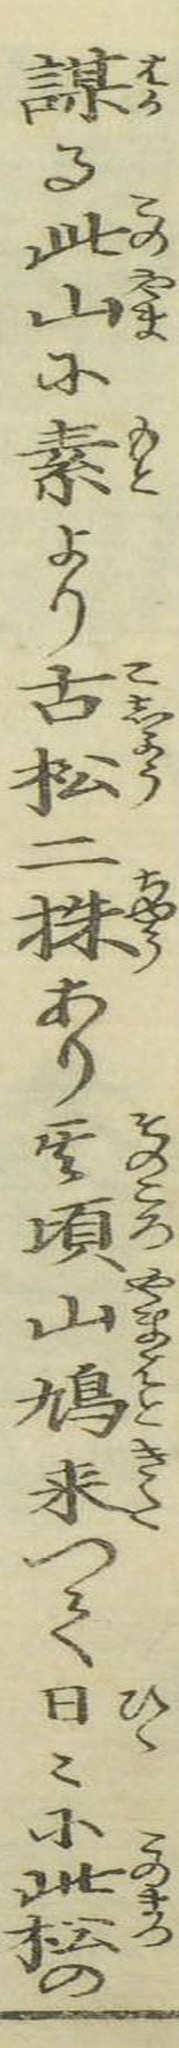謀る此山に素より古松二株あり其頃山鳩来つて日々に此松の
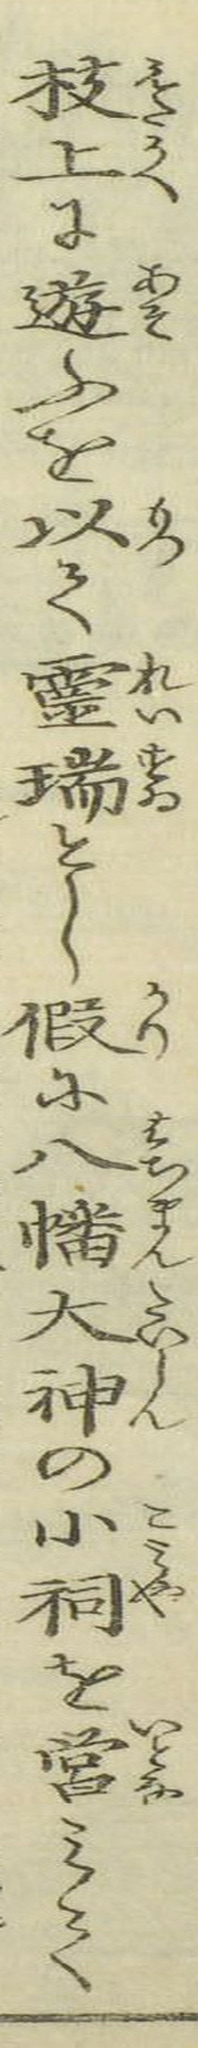枝上に遊ふを以て霊瑞とし仮に八幡大神の小祠を営みて
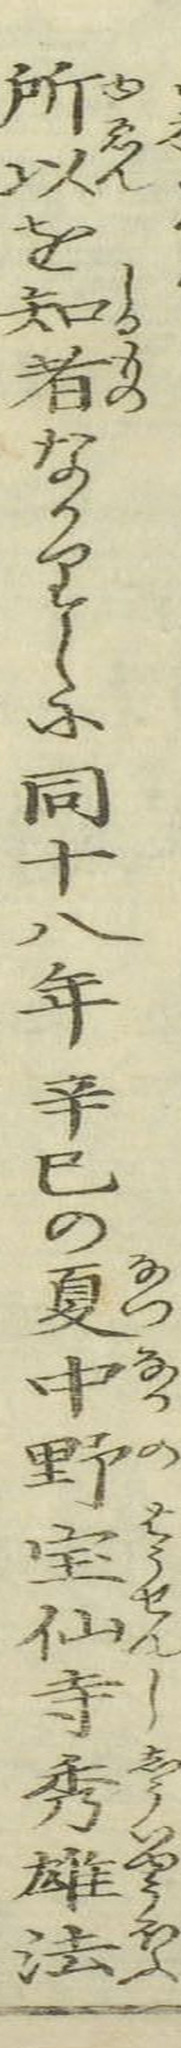所以を知者なりしに同十八年辛巳の夏中野宝仙寺秀雄法
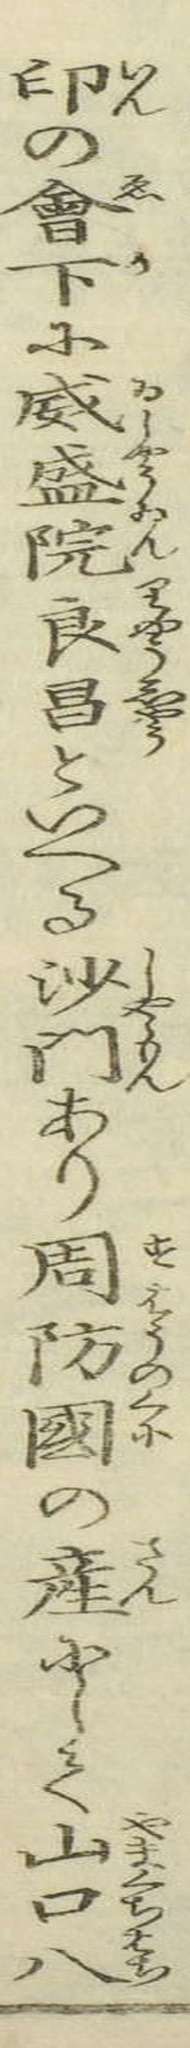印の会下に威盛院良昌といへる沙門あり周防国の産にして山口八
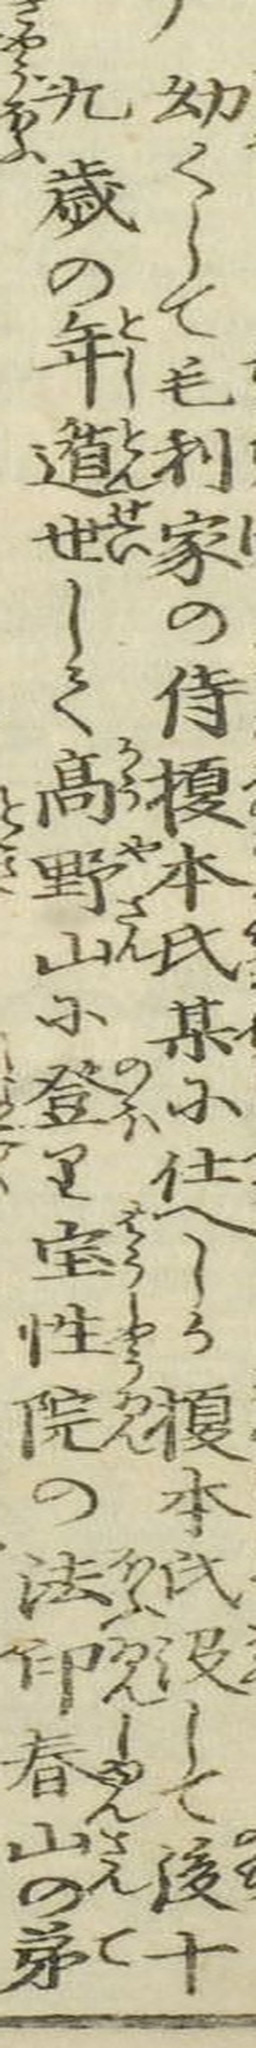九歳の年遁世して高野山に登り宝性院の法印春山の弟
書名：江戸名所図会 20巻 巻之11
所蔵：東京学芸大学教育コンテンツアーカイブ
